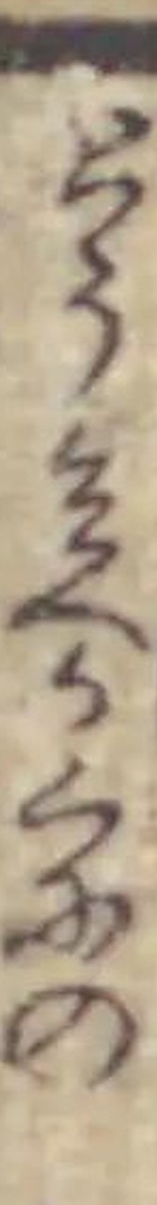とう兵へかくにの
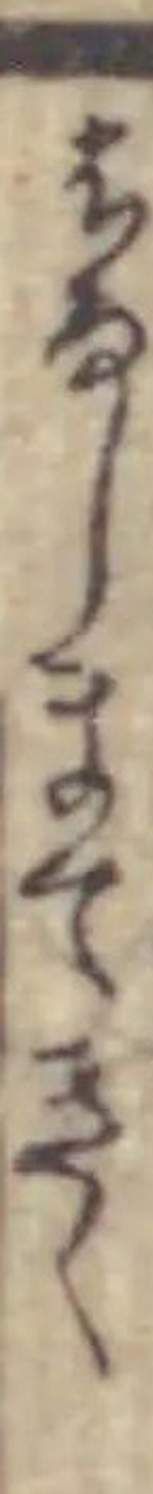はなしまてきく
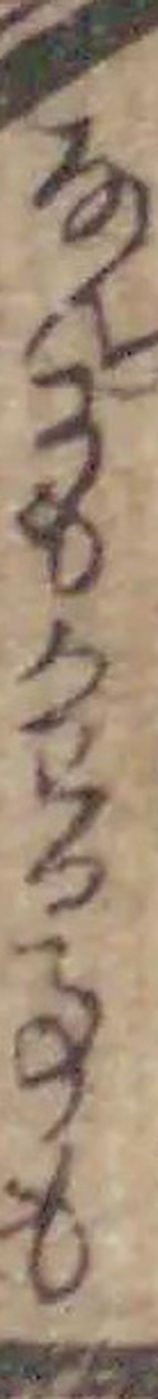なんにもかわる事も
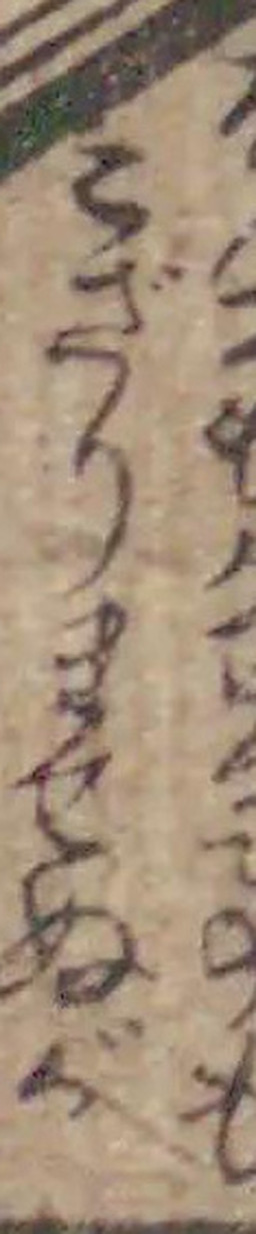ござりませぬが
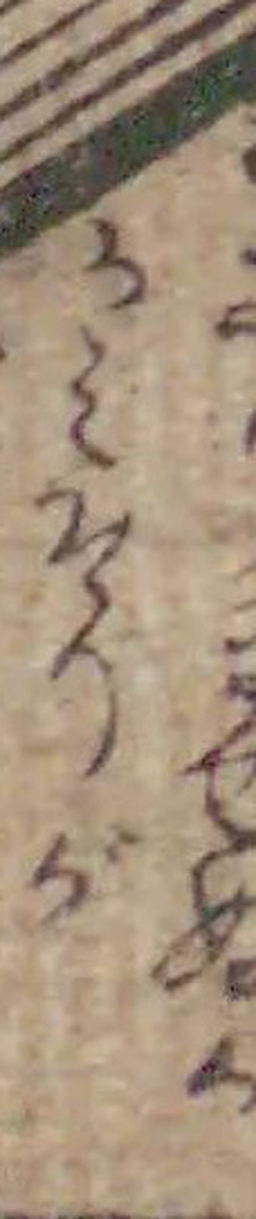かみそりが
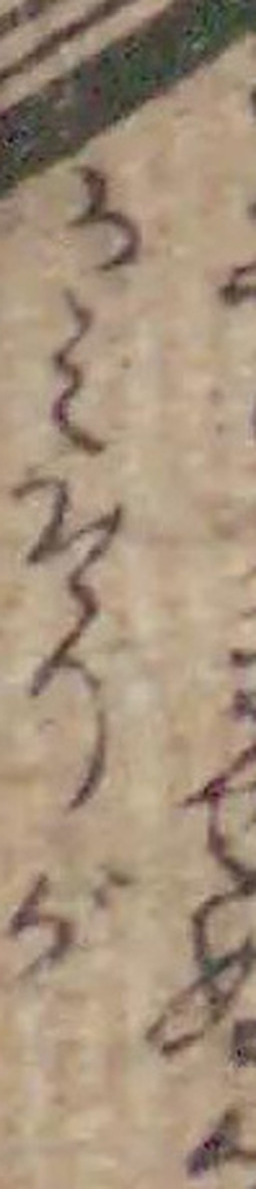かみそりが
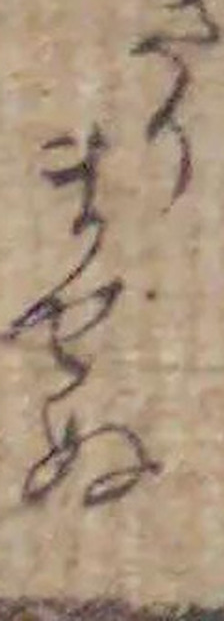ませぬ

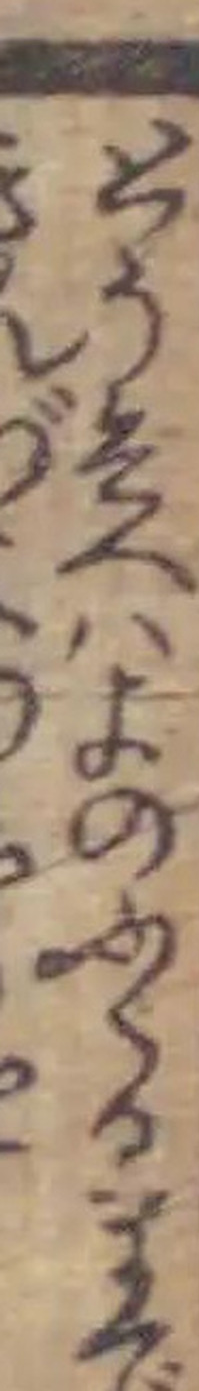とう兵へはよのふくるまで
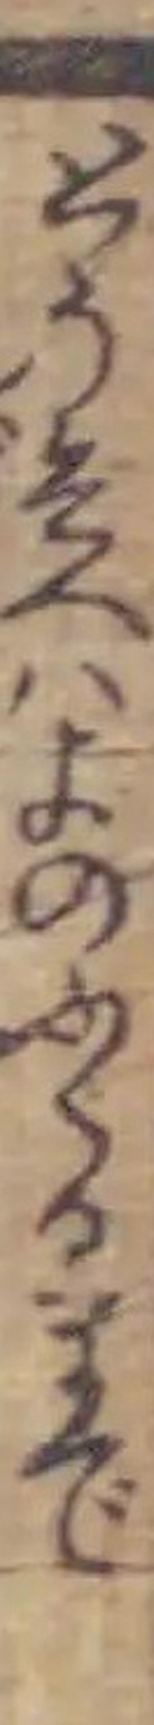とう兵へはよのふくるまで
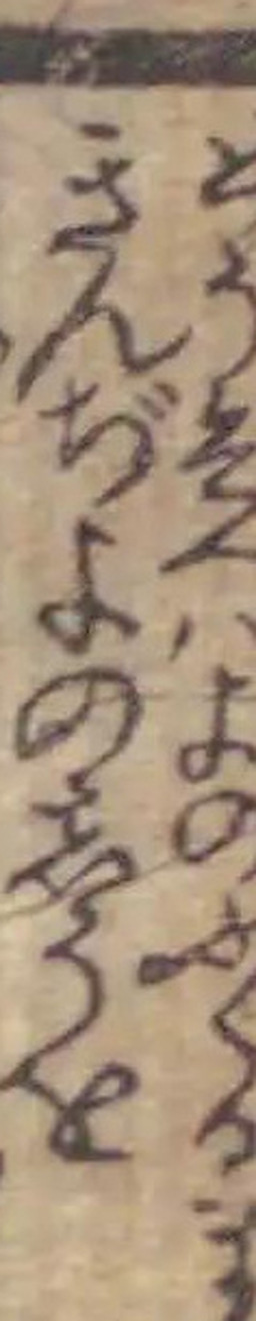きんぢよのしうを
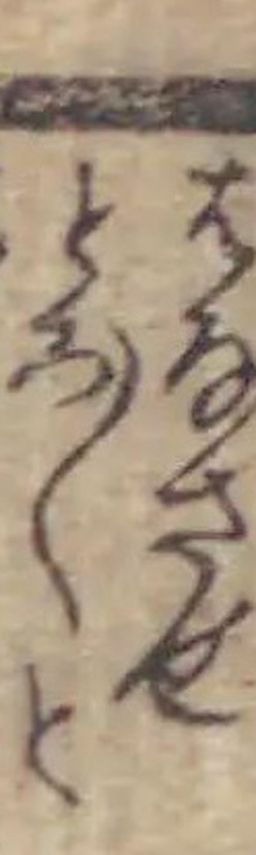とろ〳〵と
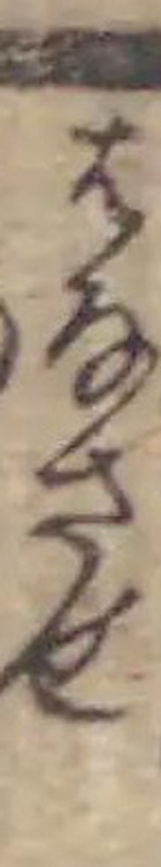はなさせ
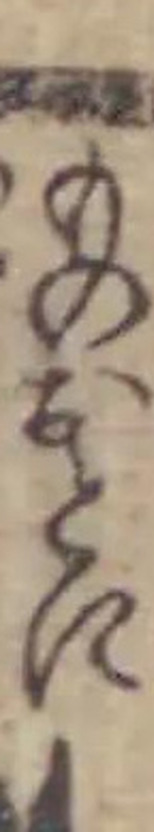ものおとに
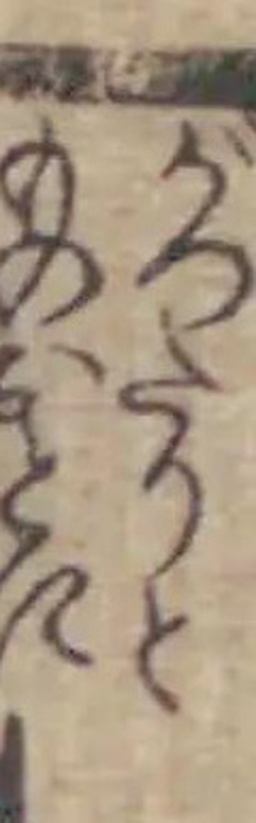ものおとに
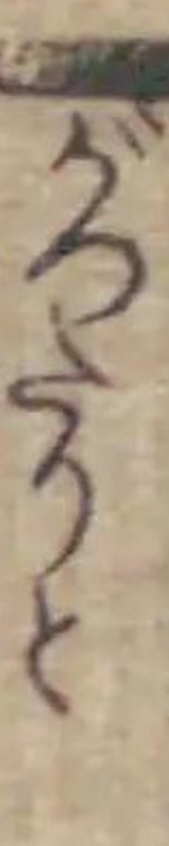がつたりと
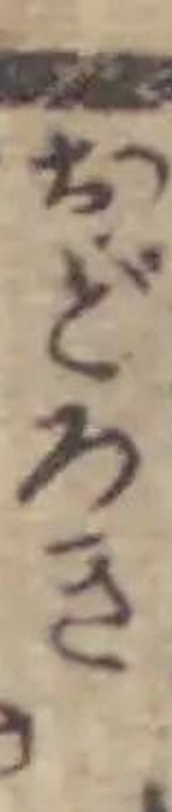おどろき
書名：間違月夜鍋 2巻
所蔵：国立国会図書館 National Diet Library, JAPAN
